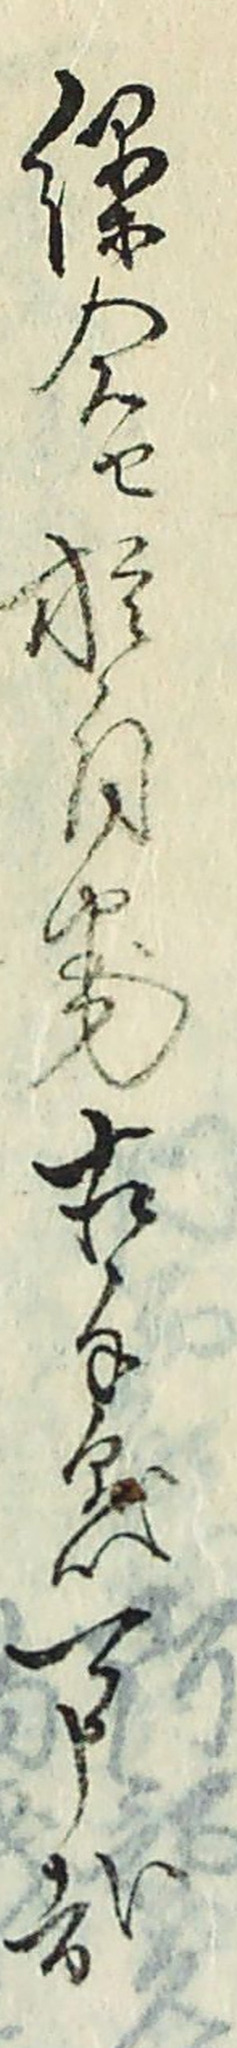繰合セ於自宅相手懸可申哉
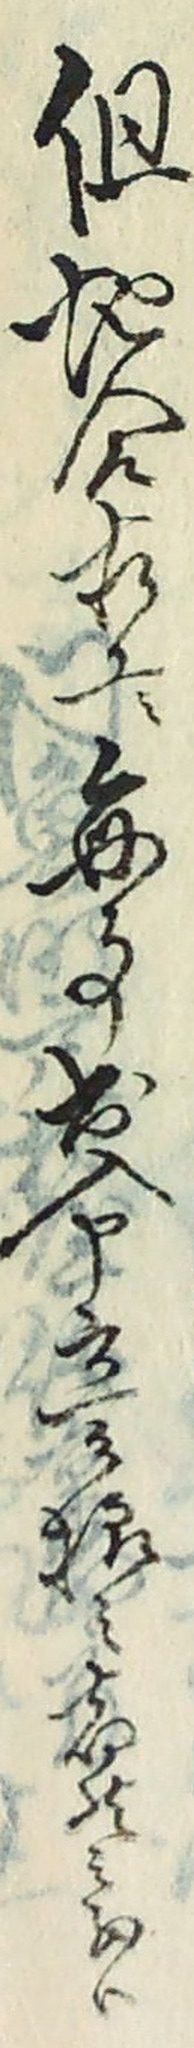但地合相工ミ毎事出入申立候様之者共之義ハ
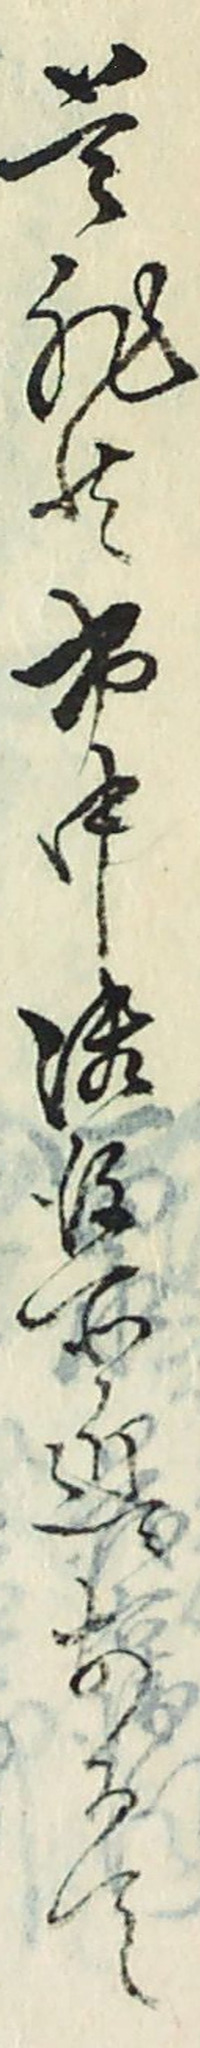是非共市中御役所近ニおゐて
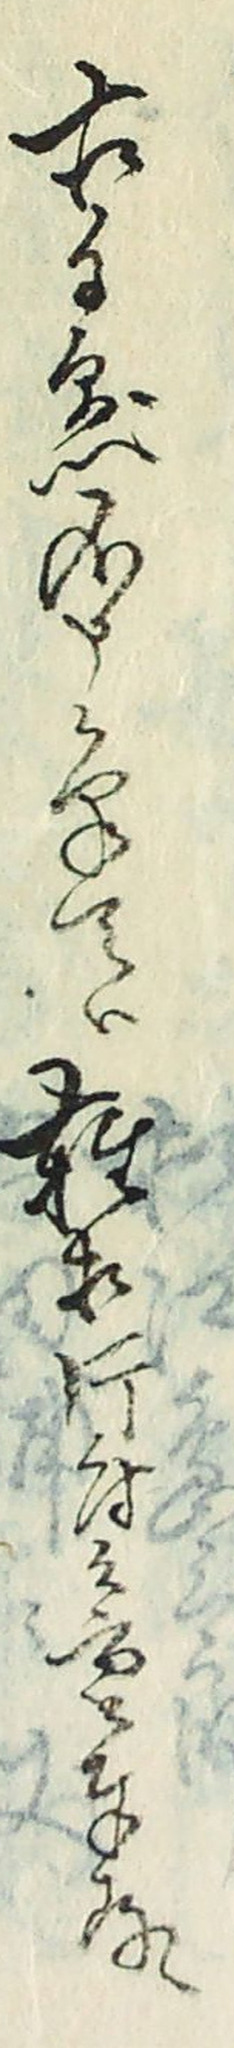相手懸不申候半てハ難相片付候方と奉存候
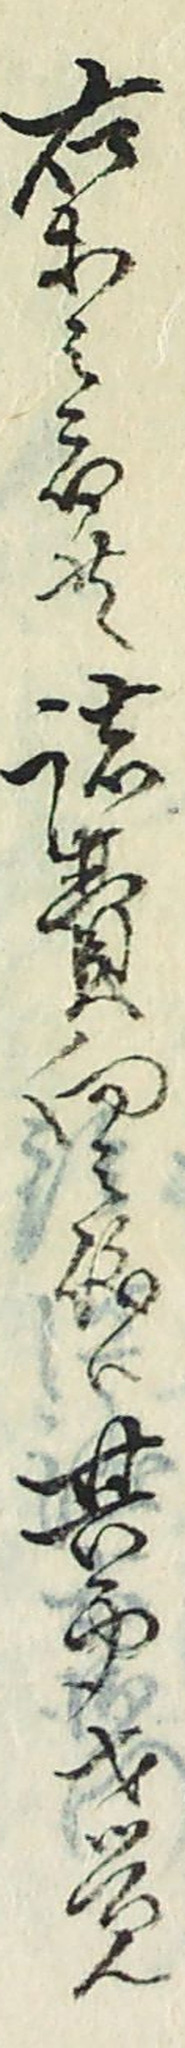右等之者共へ諸費向之儀ハ其身才覚
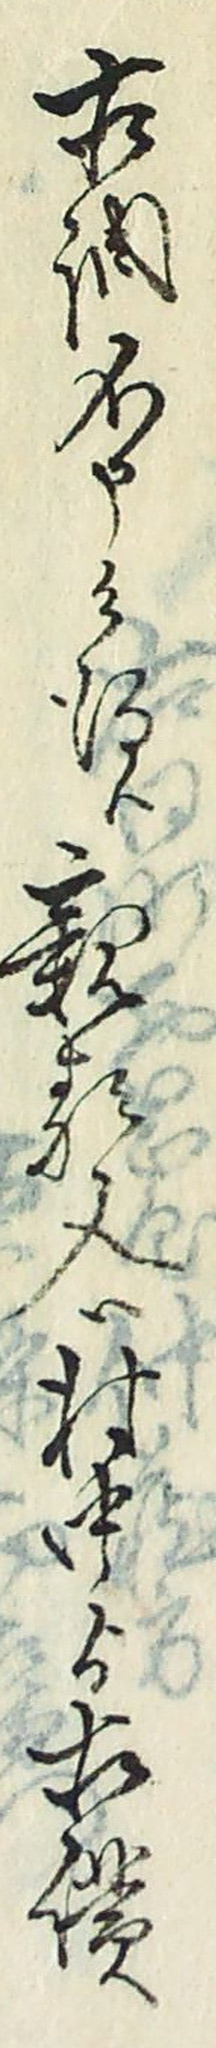相調不申候得ハ親類又ハ村中ゟ相償
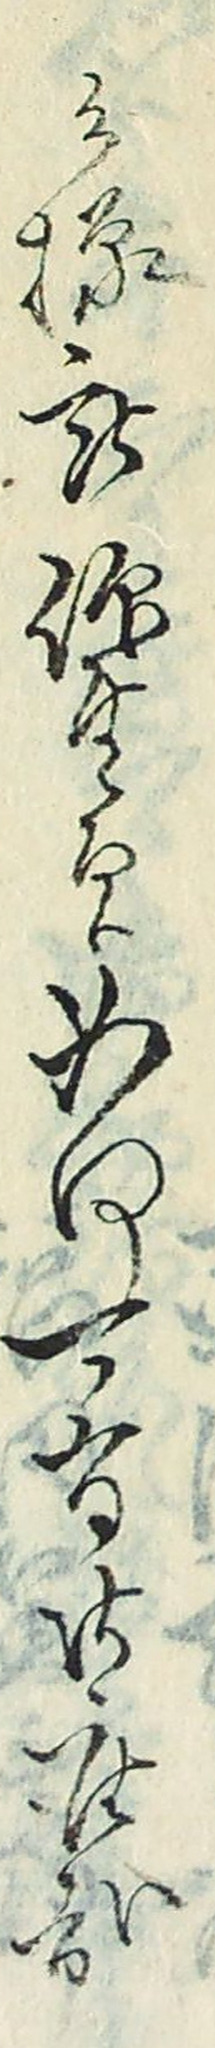候様被仰付候而ハ如何可有御座哉
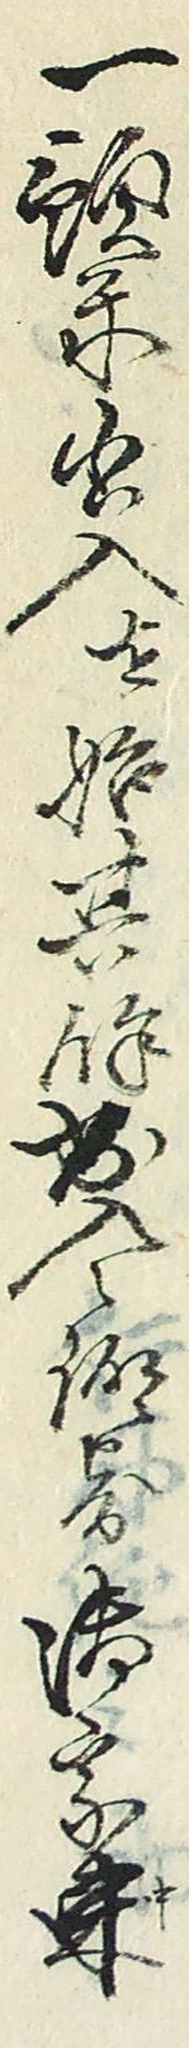一預米出入を始其餘出入之趣ニ寄御家来中
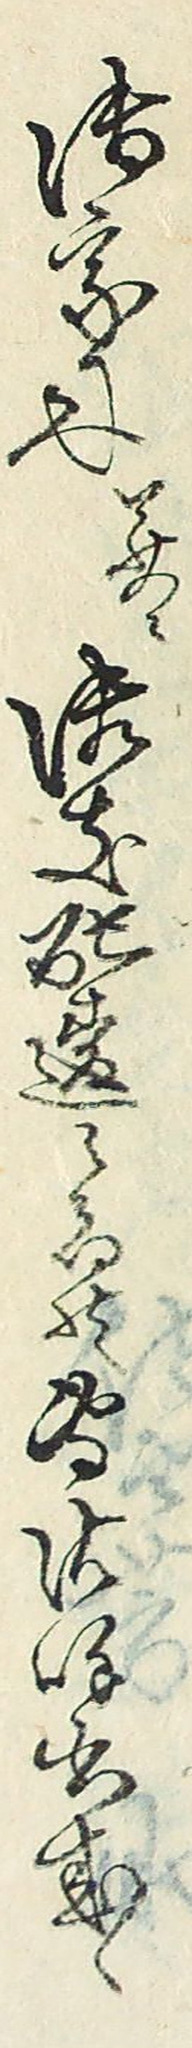御家来幷ニ御支配違之者共へ専御呼出成候

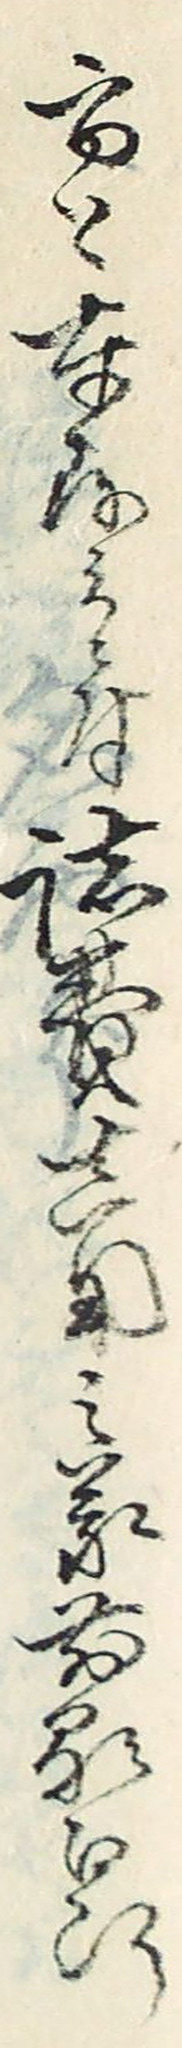方と奉存候ニ付諸費真用之義前顕同断
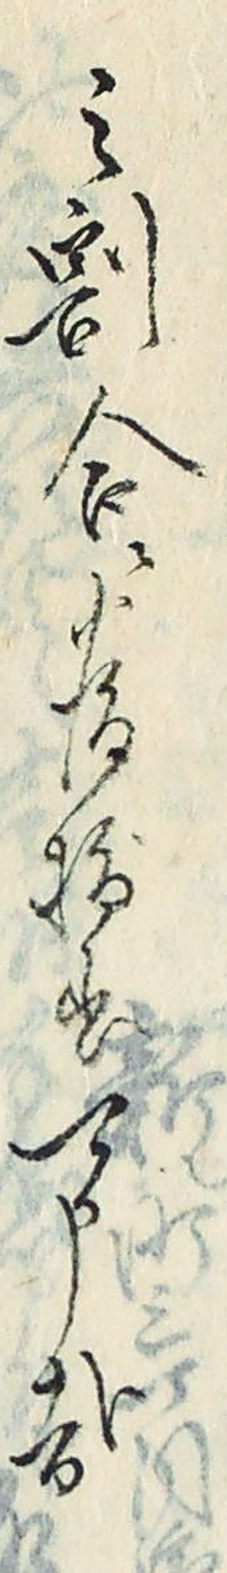之割合ニ為指出可申哉
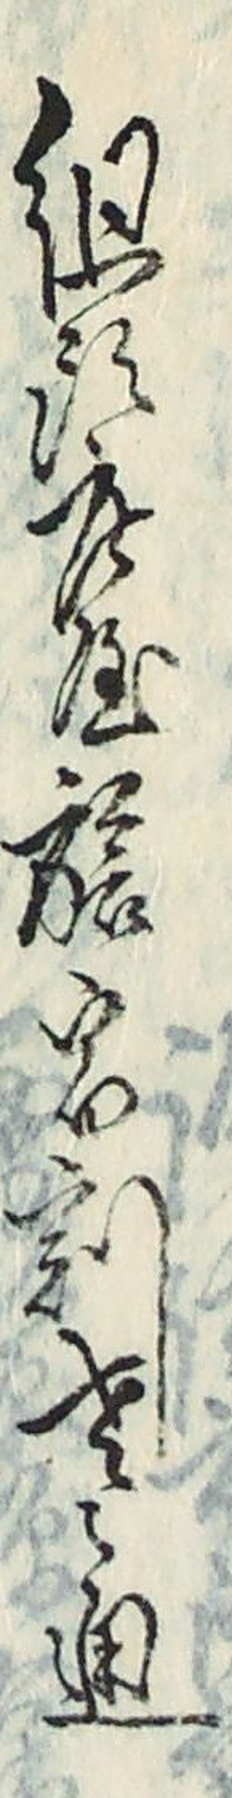組頭庄屋旅宿割左之通
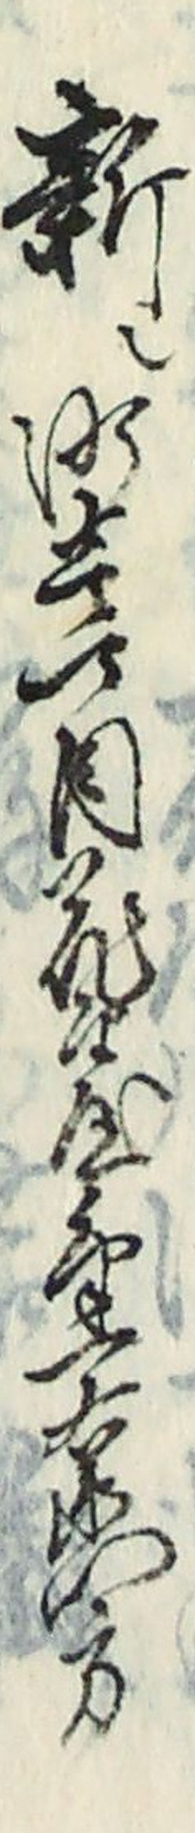新シ町壱丁目花野屋金右衛門方
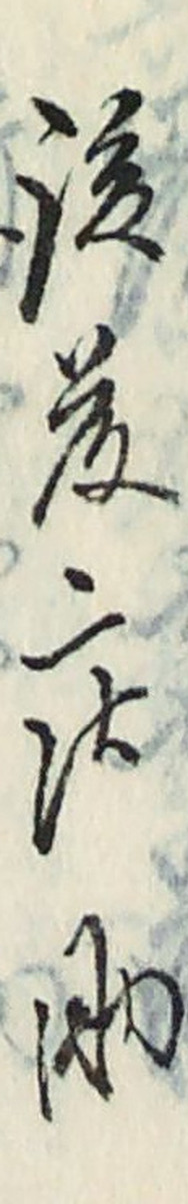後藤庄助
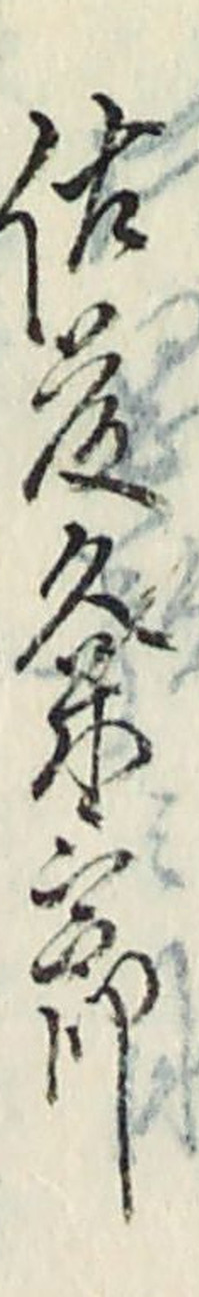佐藤粂三郎
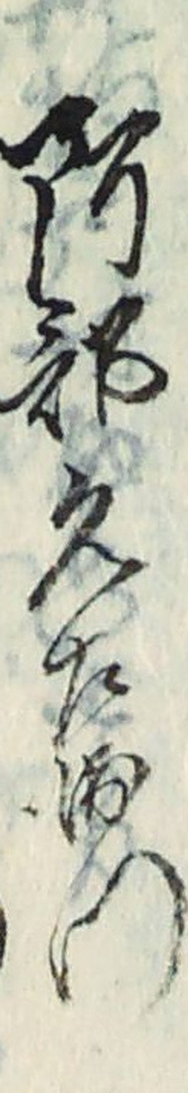阿部久左衛門
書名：諸御趣意書并御下知向之写
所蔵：鳴門教育大学 Naruto University of Education
